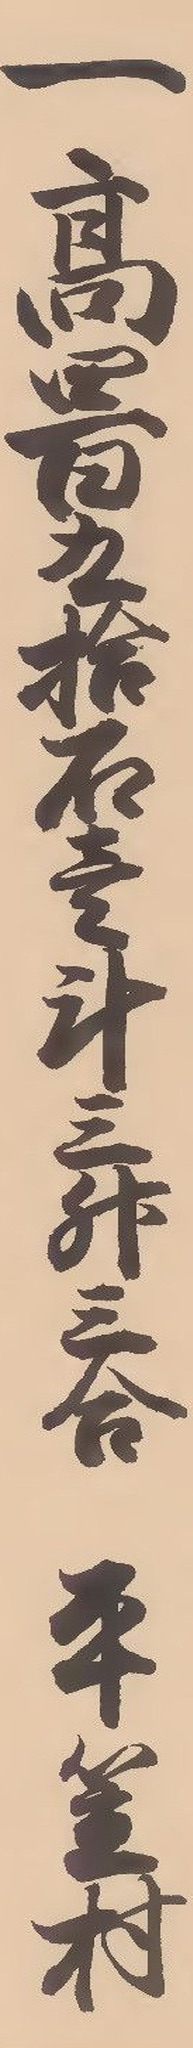一高四百九拾石壱斗三升三合平笠村

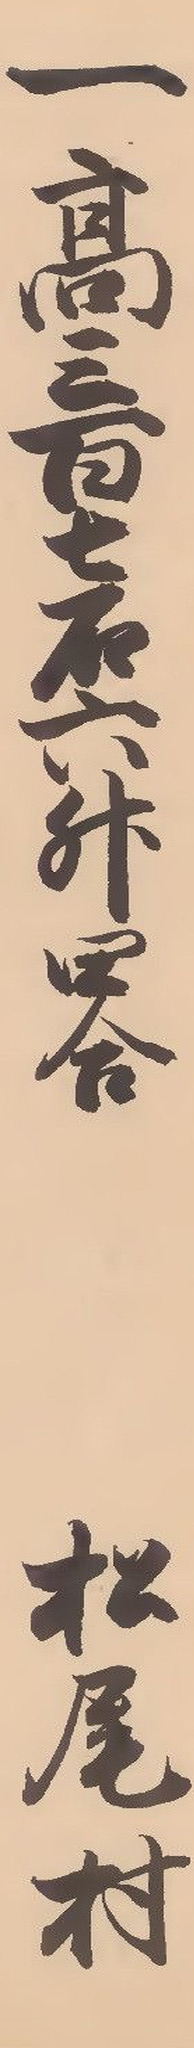一高三百七石六升四合松尾村
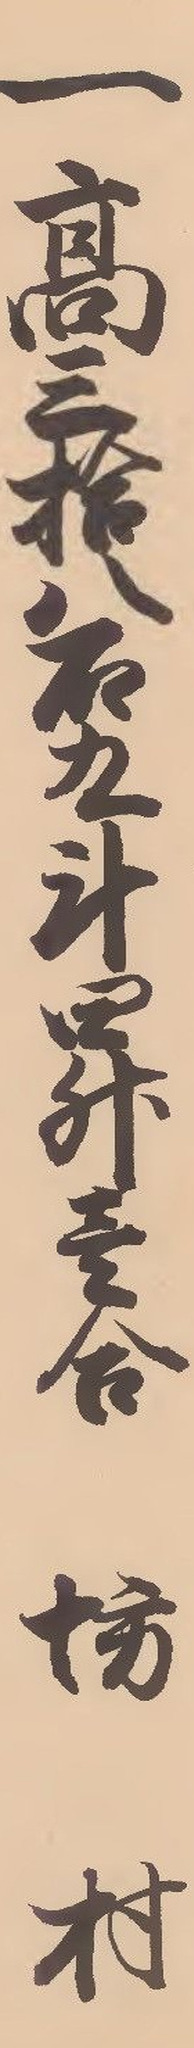一高三拾八石九斗四升壱合坊村
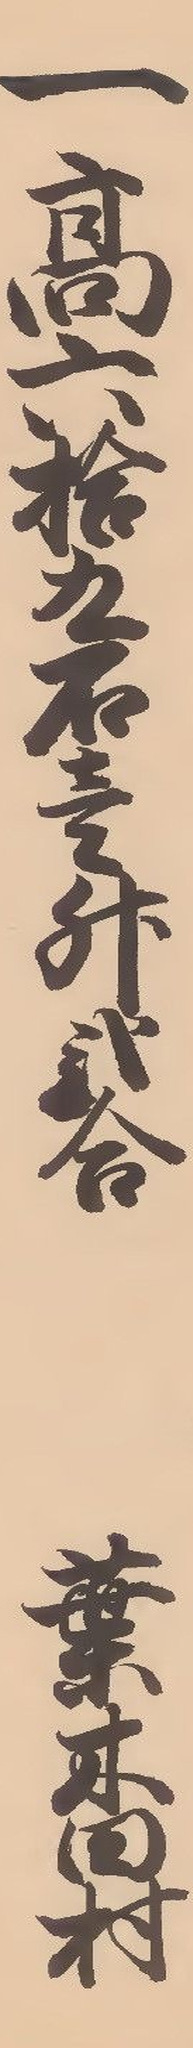一高六拾九石壱升弐合葉木田村
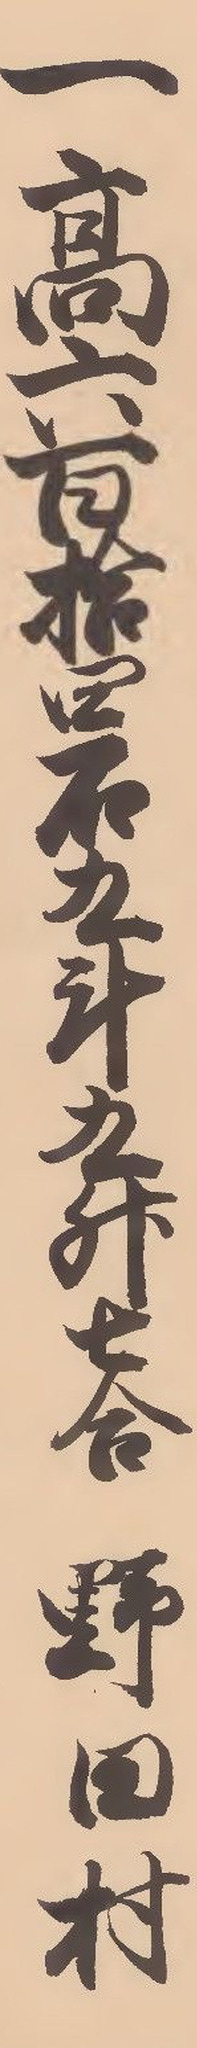一高六百拾四石九斗九升七合野田村
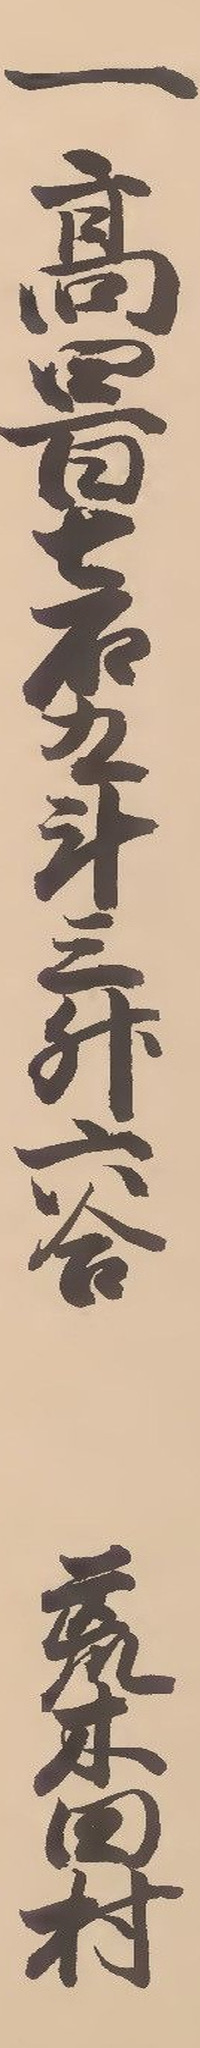一高四百七石九斗三升六合荒木田村
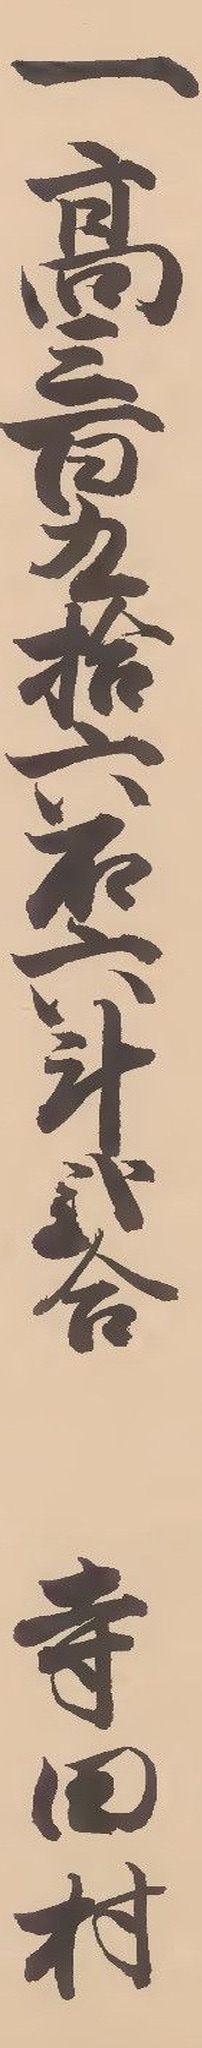一高三百九拾六石六斗弐合寺田村
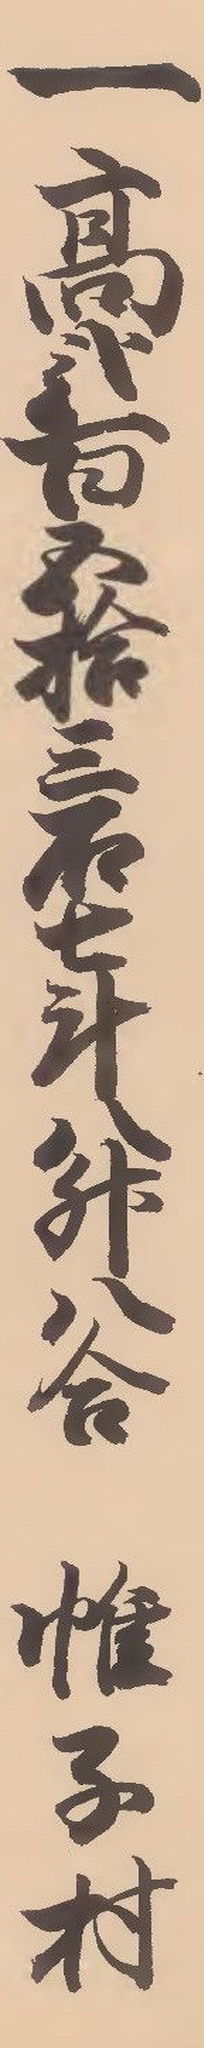一高弐百五拾三石七斗八升八合惟子村
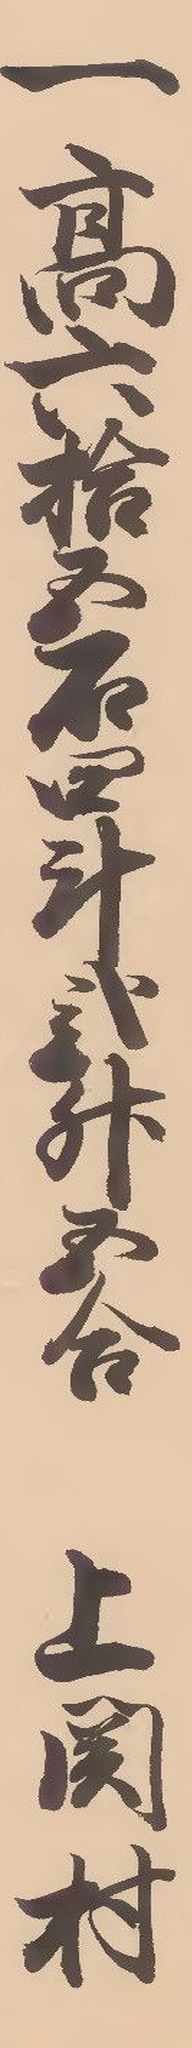一高六拾五石四斗弐升五合上関村

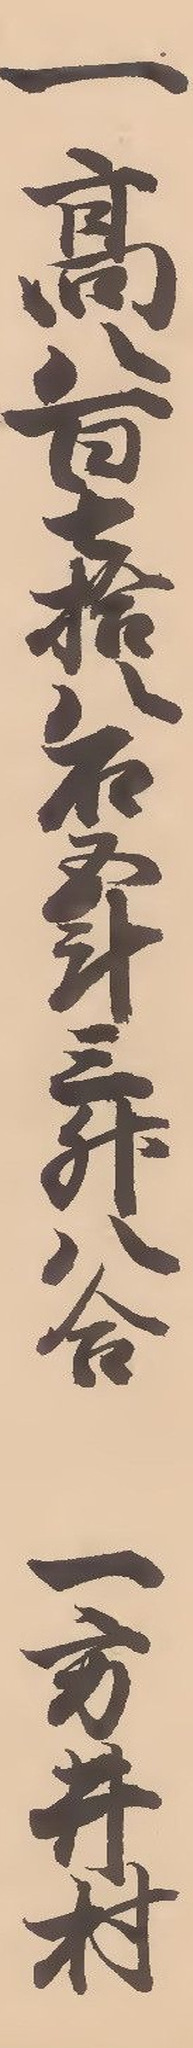一高八百七拾八石五斗三升八合一方井村
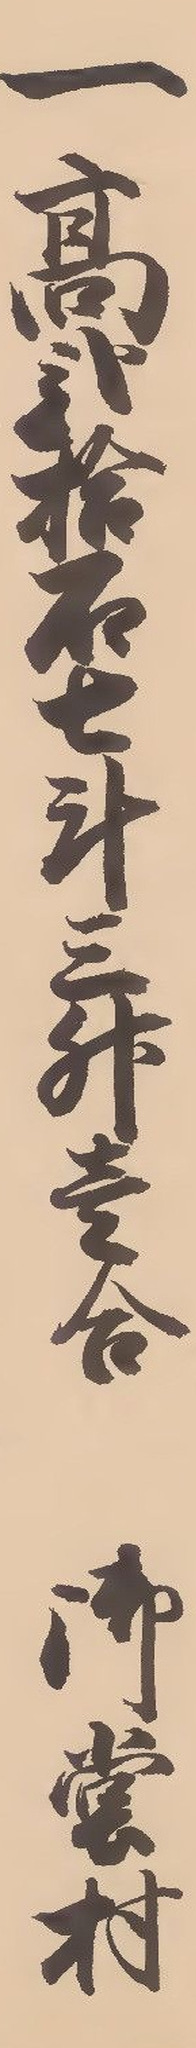一高弐拾石七斗三升壱合御堂村
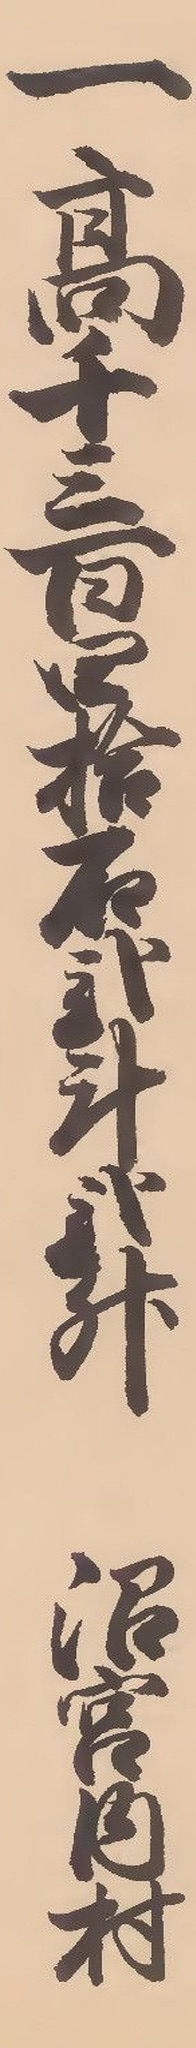一高千三百四拾石弐斗弐升沼宮内村
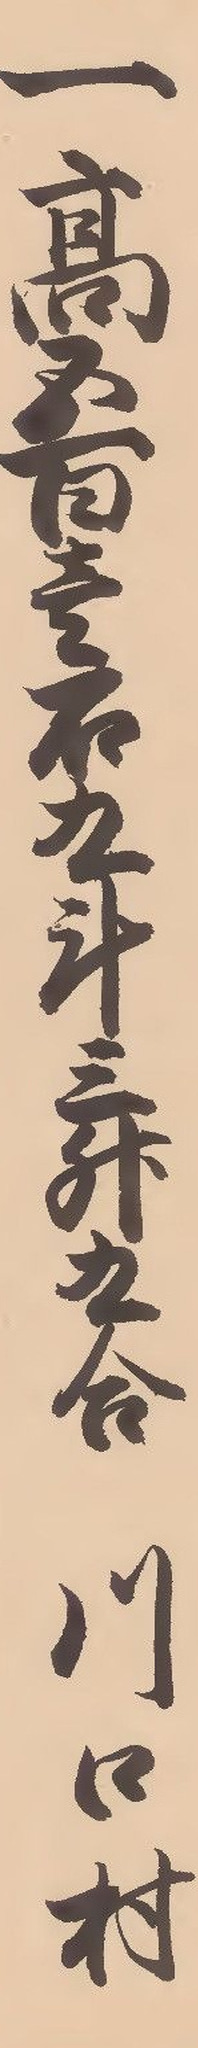一高五百壱石九斗三升九合川口村
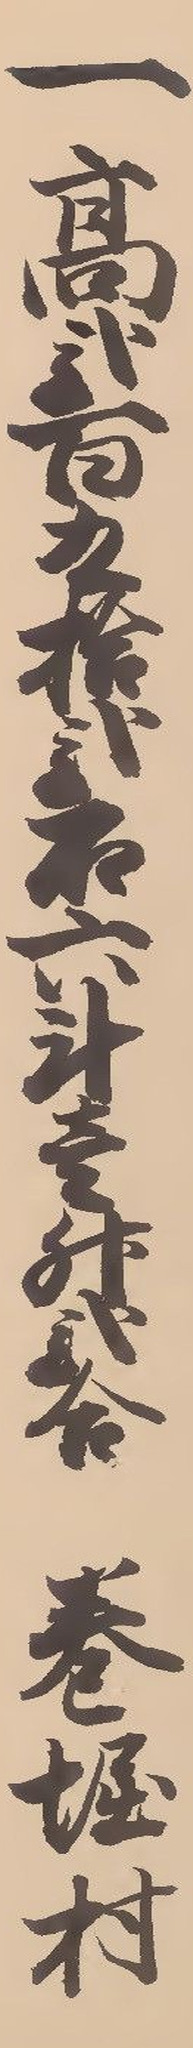一高弐百九拾弐石六斗壱升弐合巻堀村
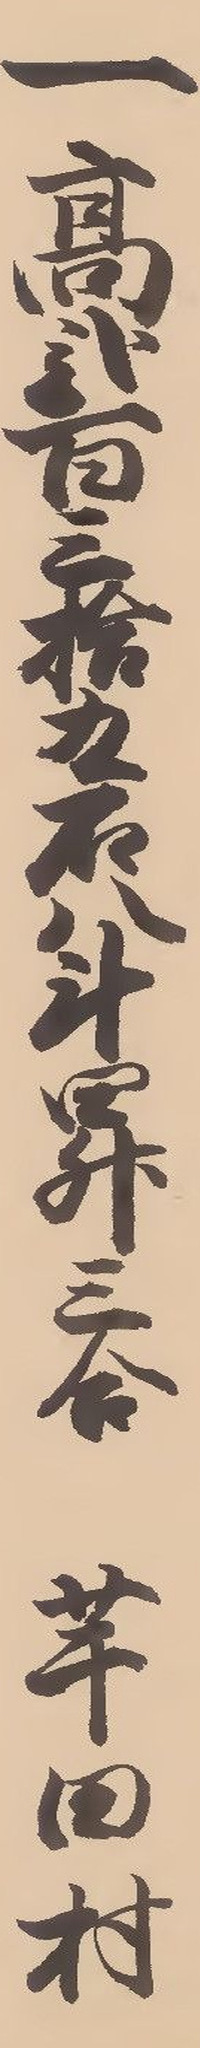一高弐百三拾九石八斗四升三合芋田村
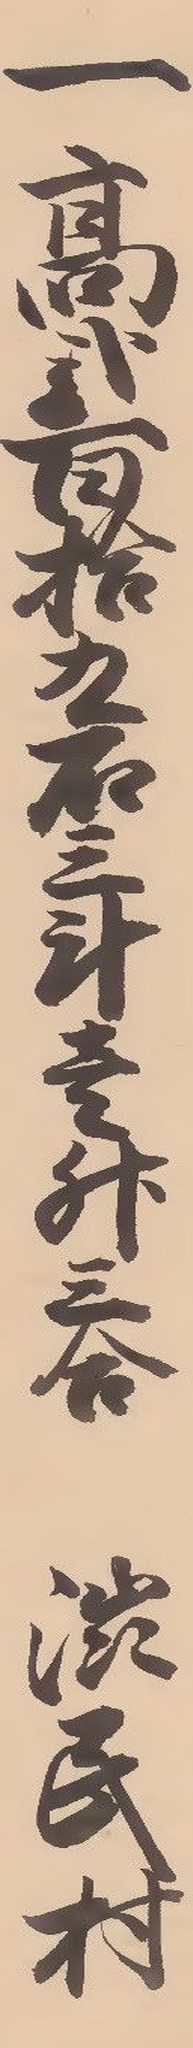一高弐百拾九石三斗壱升三合渋民村
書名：陸奥国郷帳　６
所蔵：国立公文書館 National Archives of Japan
